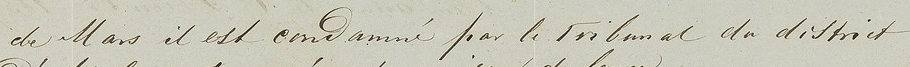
de Mars il est condamné par le tribunal du district
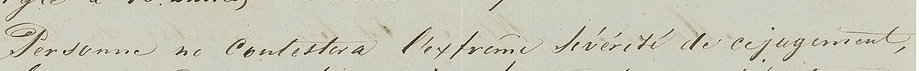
Personne ne contestera l'extrême sévérité de ce jugement,
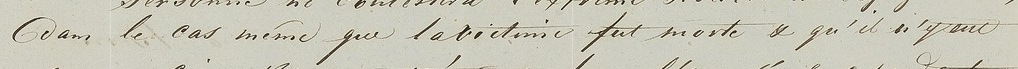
dans le cas même que la victime fut morte & qu'il y eut
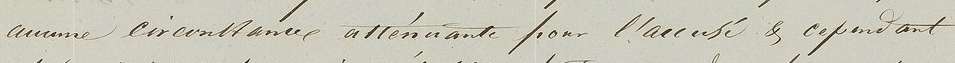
aucune circonstance atténuante pour l'accusé & cependant
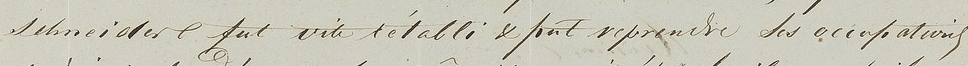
Schneider fut vite rétabli & put reprendre ses occupations
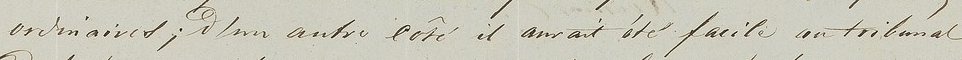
ordinaires; d'un autre côté il aurait été facile au tribunal
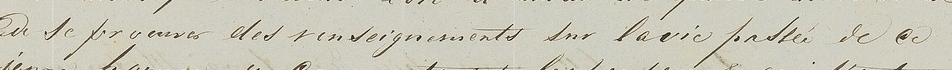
de se procurer des renseignements sur la vie passée de ce
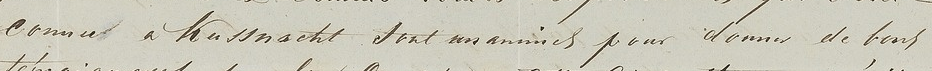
connu à Kussnacht sont unanimes pour donner de bons
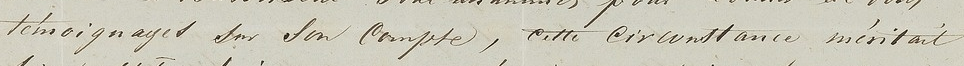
témoignages sur son compte, cette circonstance méritait
